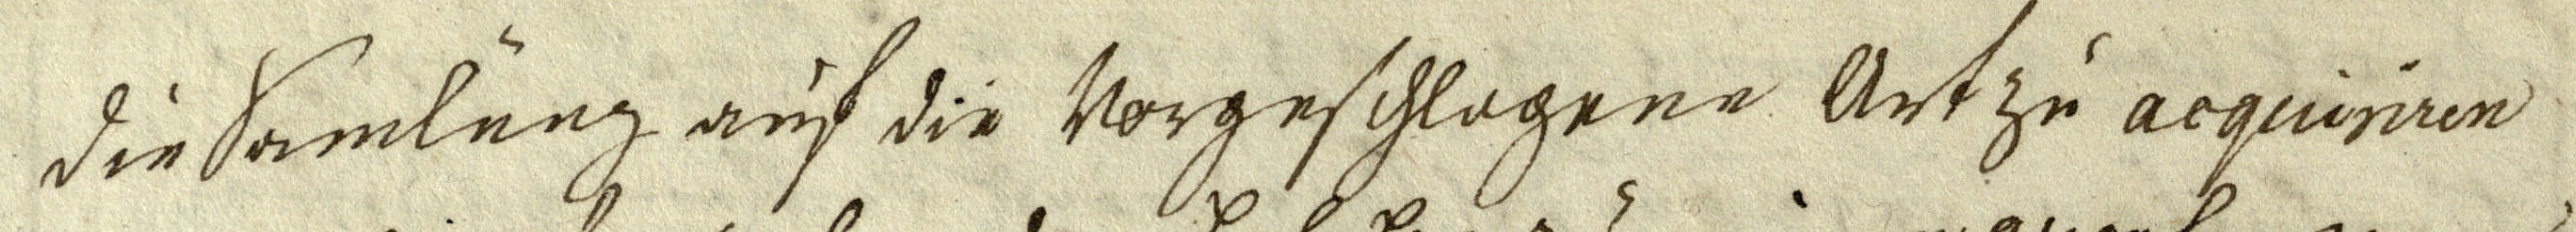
die Samlung auf die vorgeschlagene Art zu acquiriren
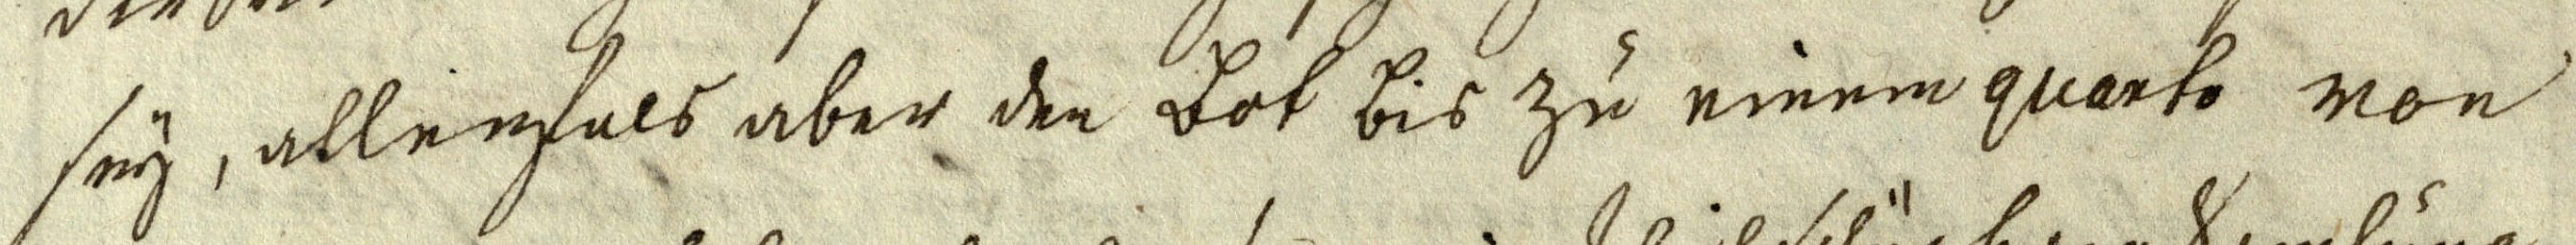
seÿ, allenfals aber den Bot bis zu einem quarto von
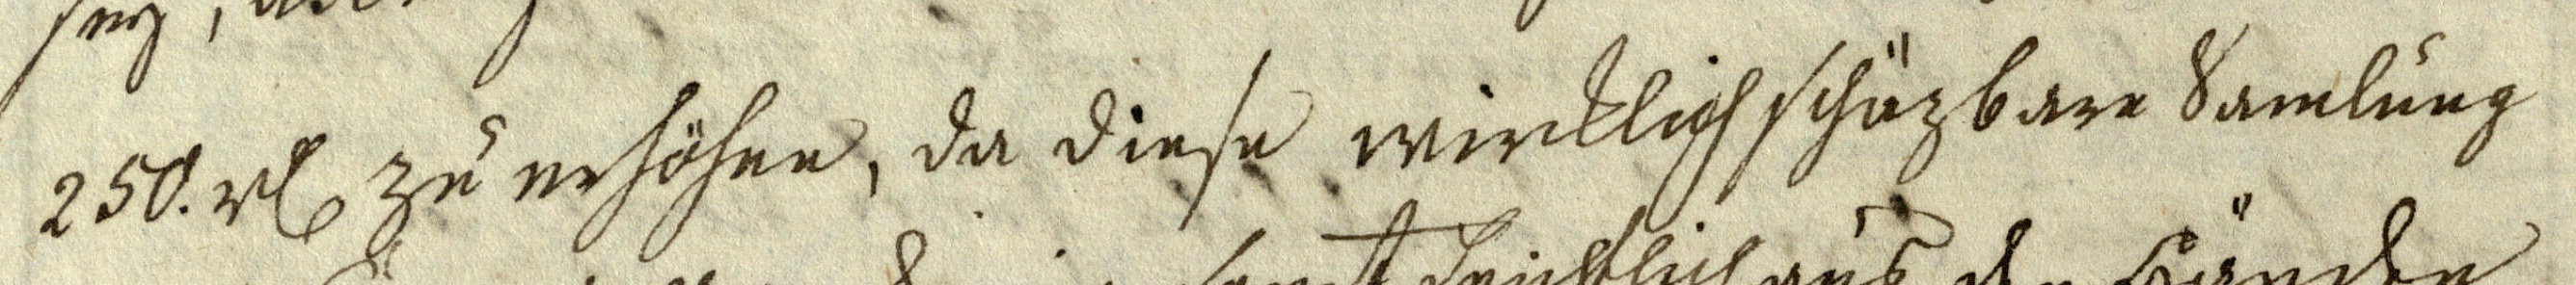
250 r. zu erhöhen, da diese wircklich schäzbare Samlung
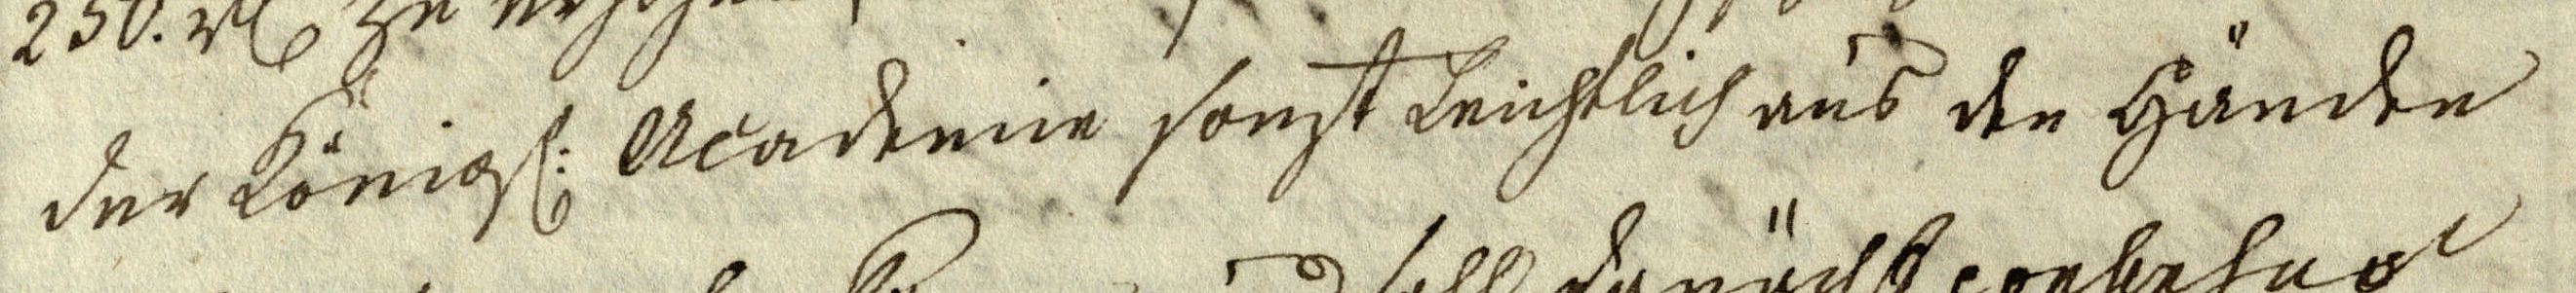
der Königl. Academie sonst leichtlich aus den Händen
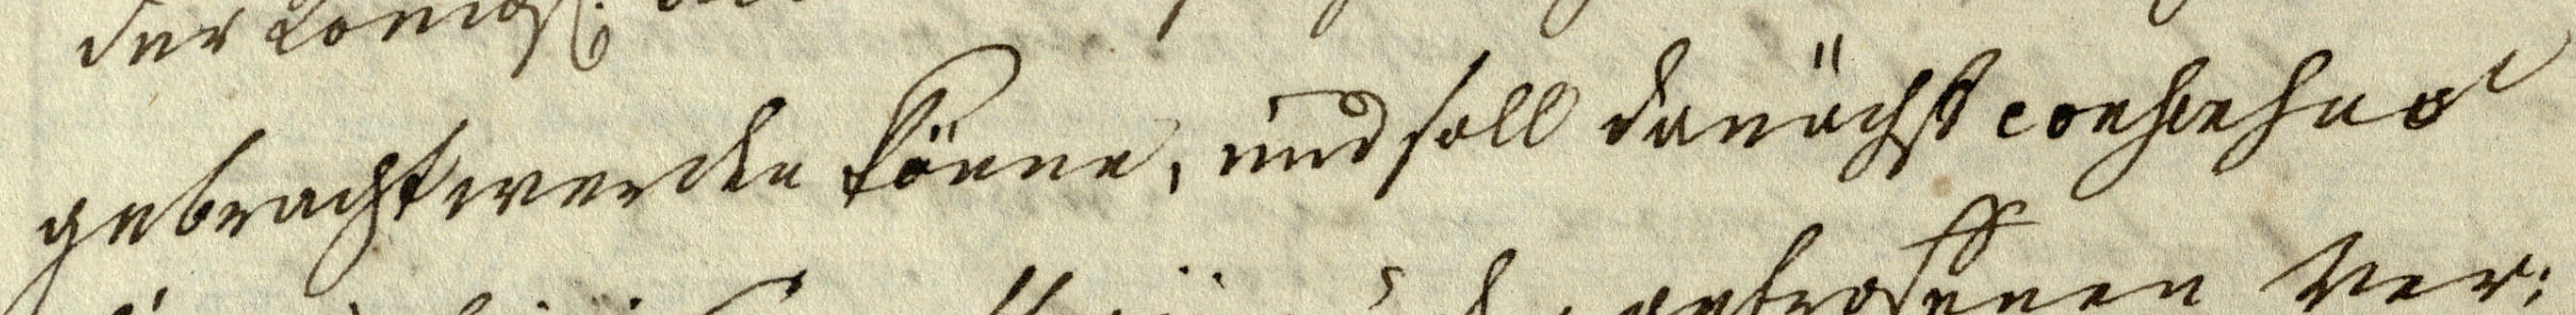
gebracht werden könne, und soll danächst consensus
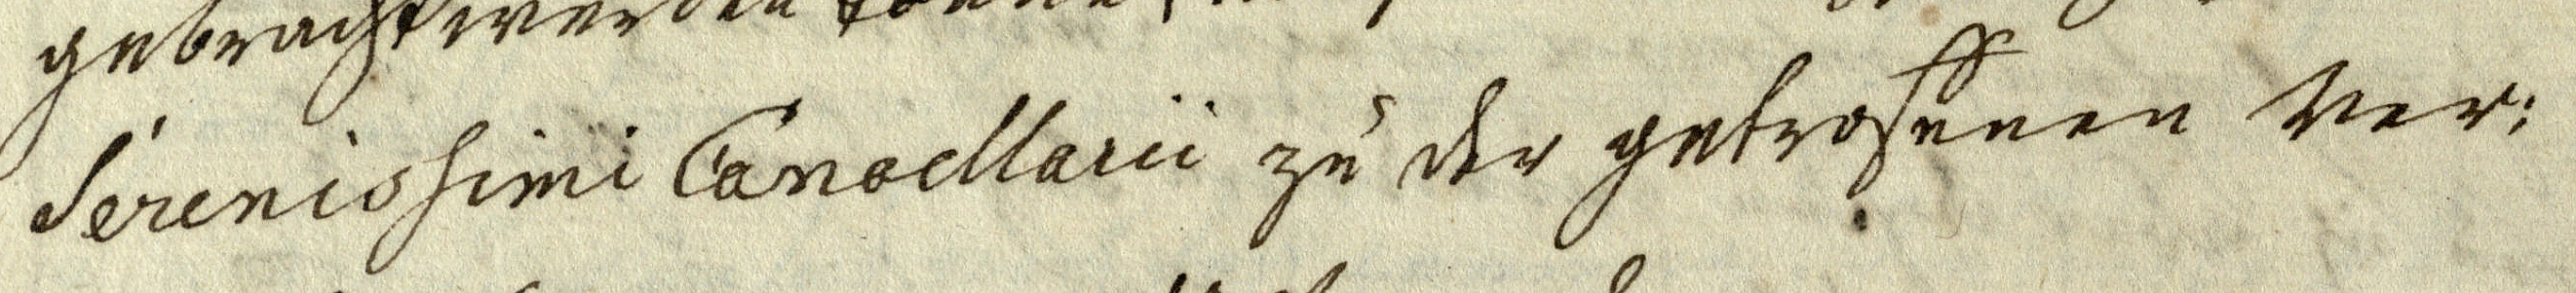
Serenissimi Cancellarii zu der getroffenen Ver¬
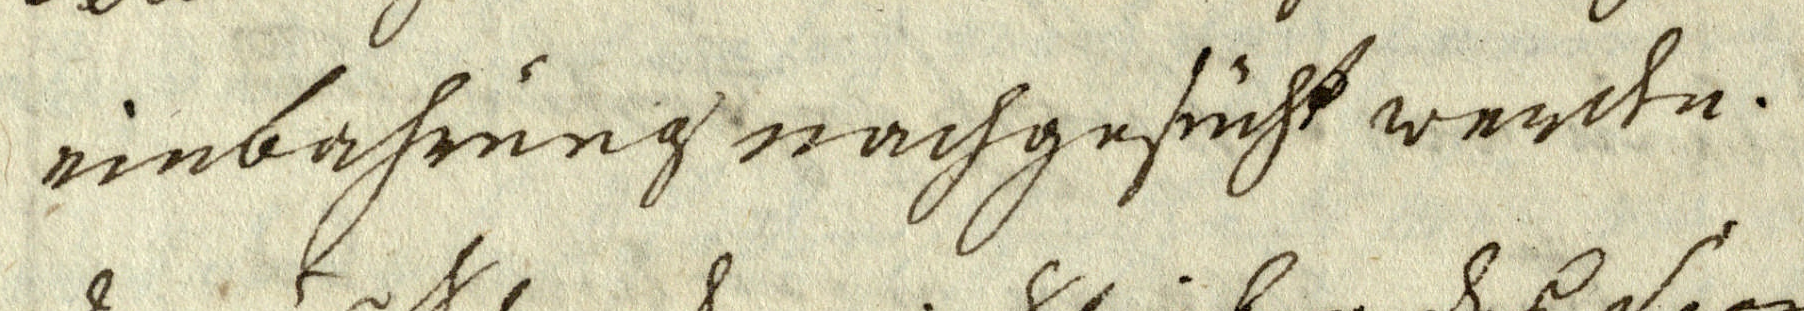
einbahrung nachgesucht werden.
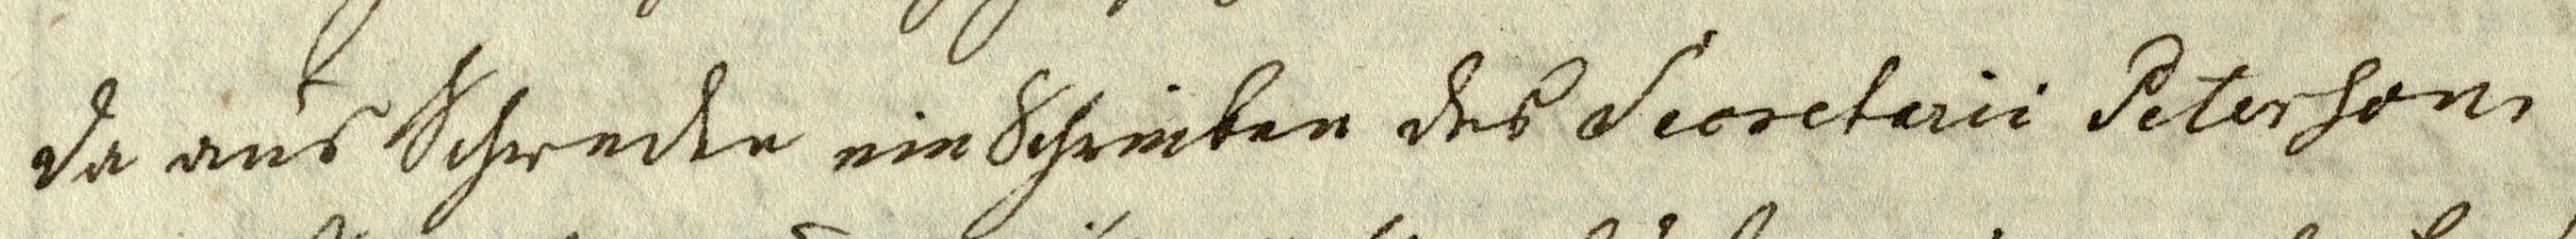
Da aus Schweden ein Schreiben des Secretarii Peterson
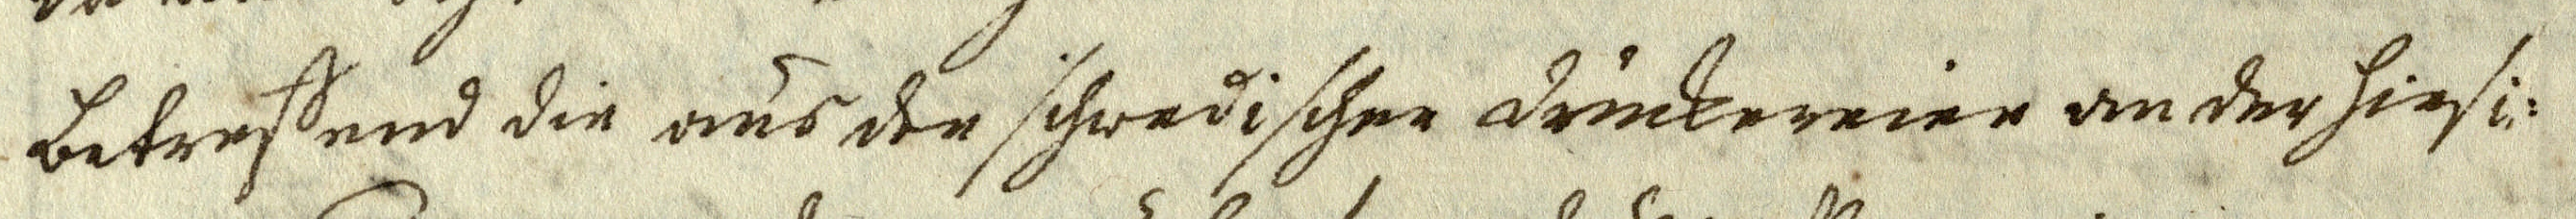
betreffend die aus den schwedischen Druckereien an der hiesi¬
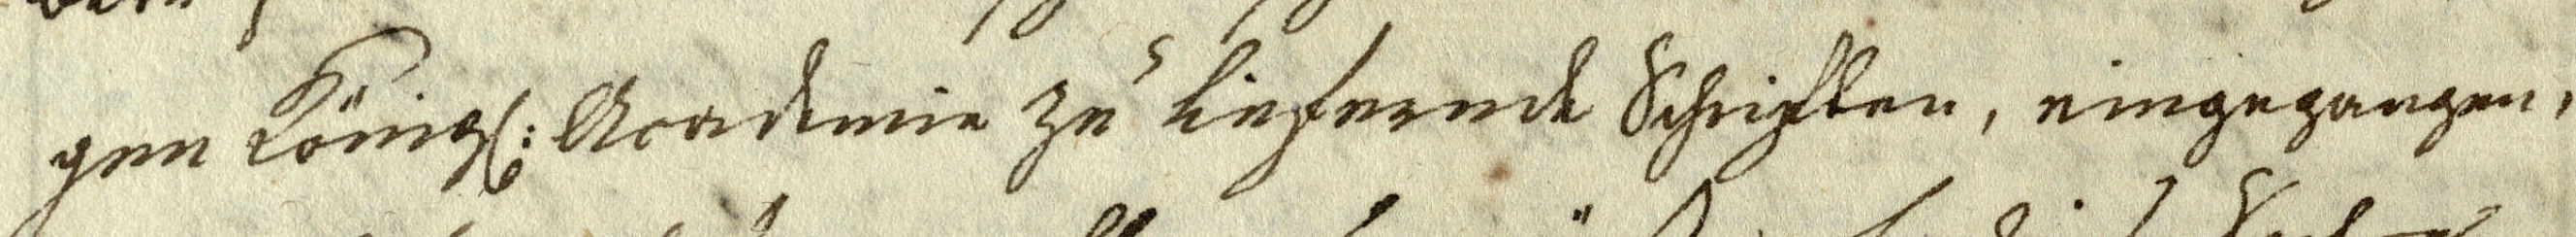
gen Königl. Academie zu liefernde Schriften, eingegangen,
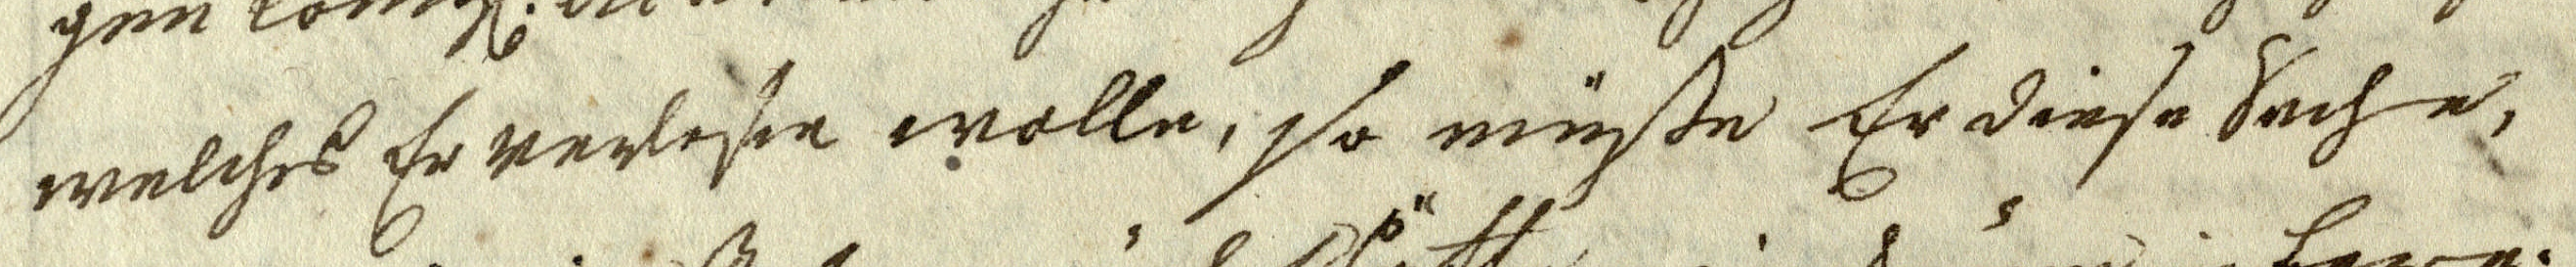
welches Er verlesen wolle, so müße Er diese Sache,
